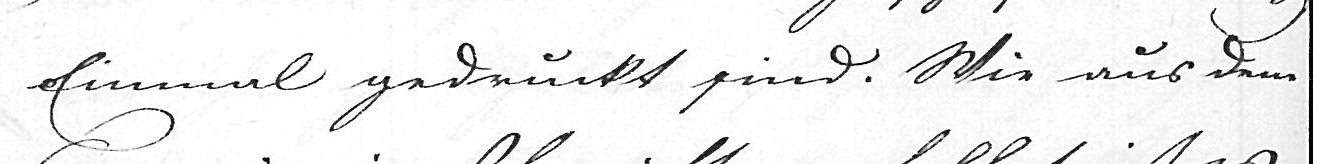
Einmal gedruckt sind. Wie aus dem
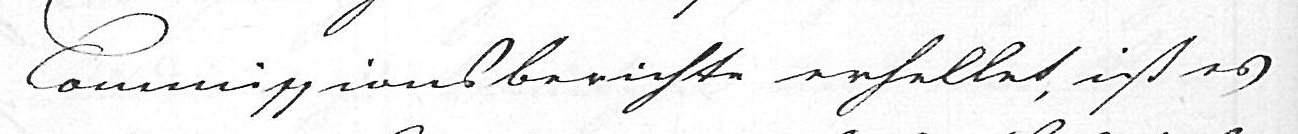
Commissionsberichte erhellet, ist es
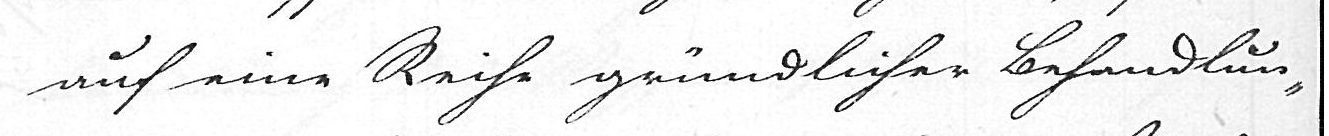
auf eine Reihe gründlicher Behandlun-
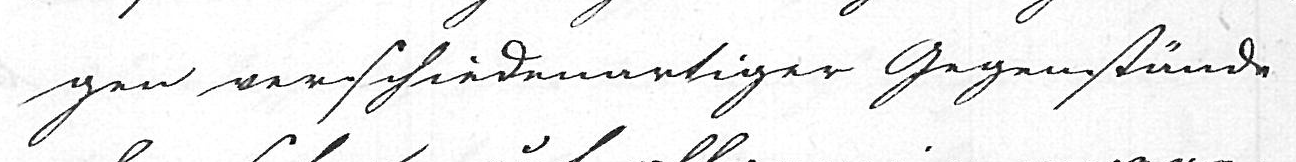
gen verschiedenartiger Gegenständen
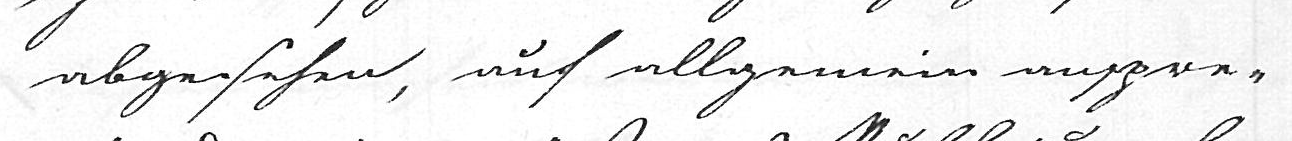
abgesehen, auf allgemein anspre-
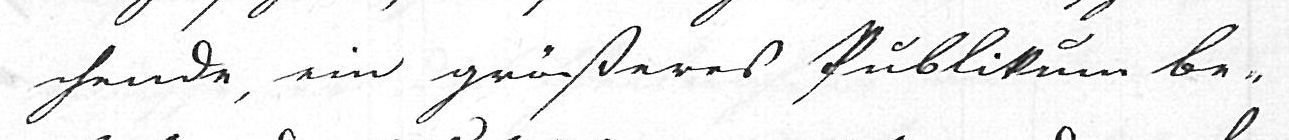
chenden, ein größeres Publikum be-
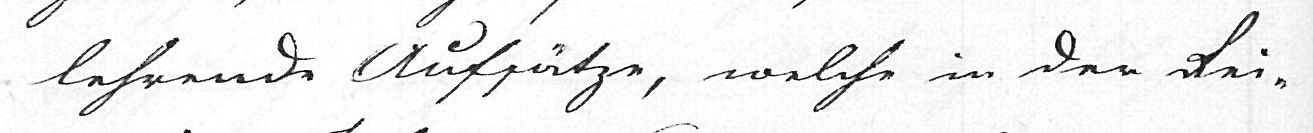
lehrende Aufsätze, welche in der Rei-
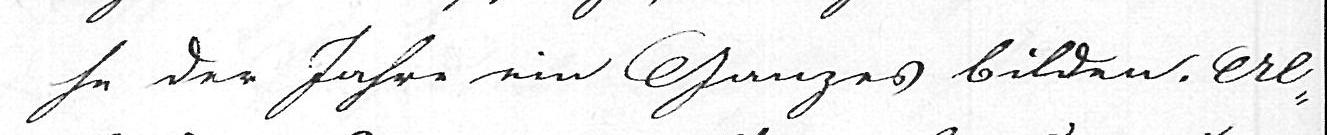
che der Jahre ein Ganzes bilden. Al-
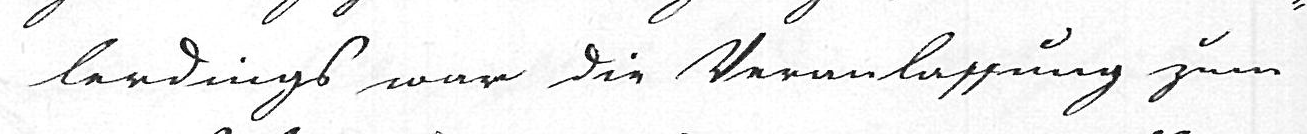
lerdings war die Veranlassung zum
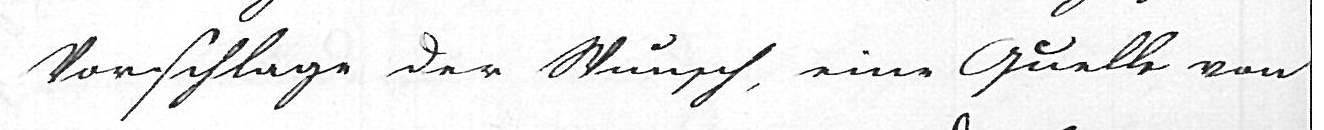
Vorschlage der Wunsch, eine Quelle von
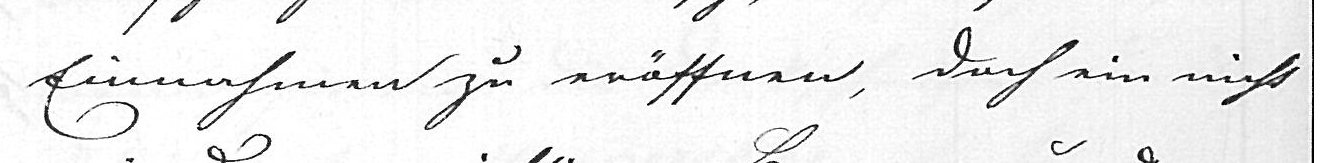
Einnahmen zu eröffnen, doch ein nicht
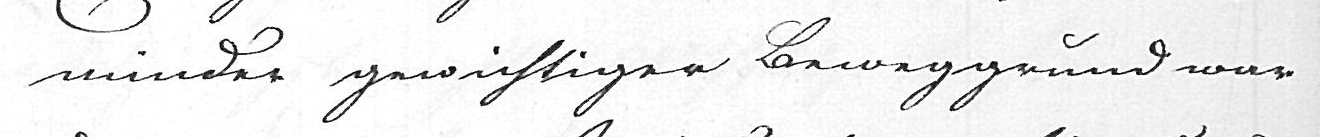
minder gewichtiger Beweggrund war
